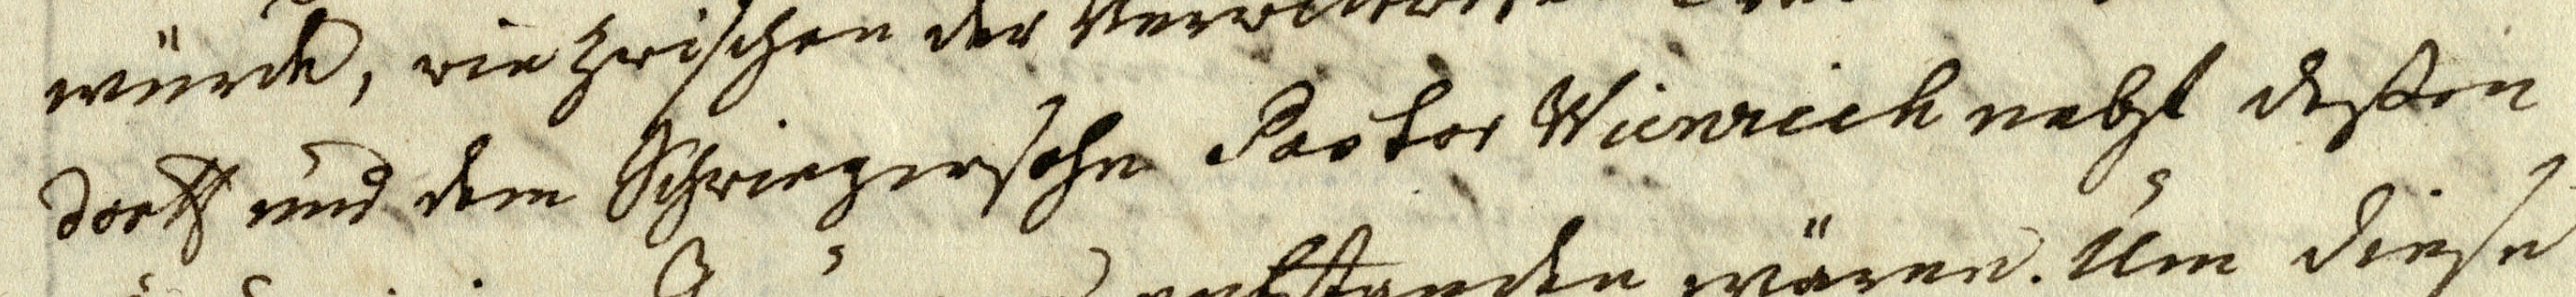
dorff und dem Schwiegersohn Pastor Wienrich nebst deßen
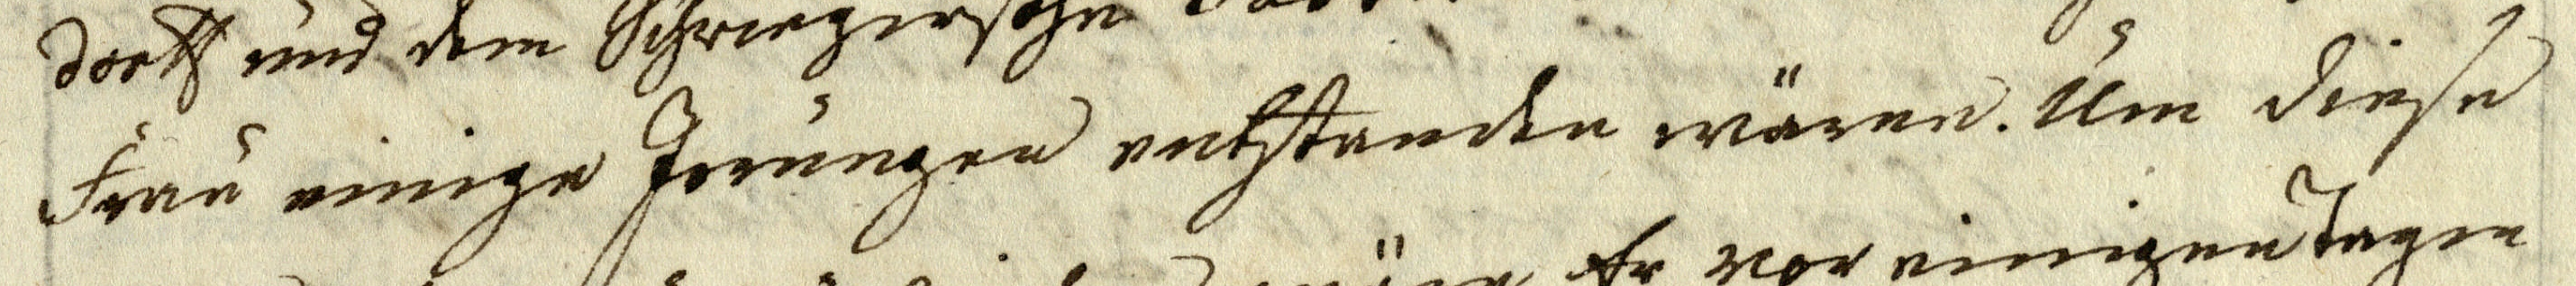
Frau einige Irrungen entstanden wären. Um diese
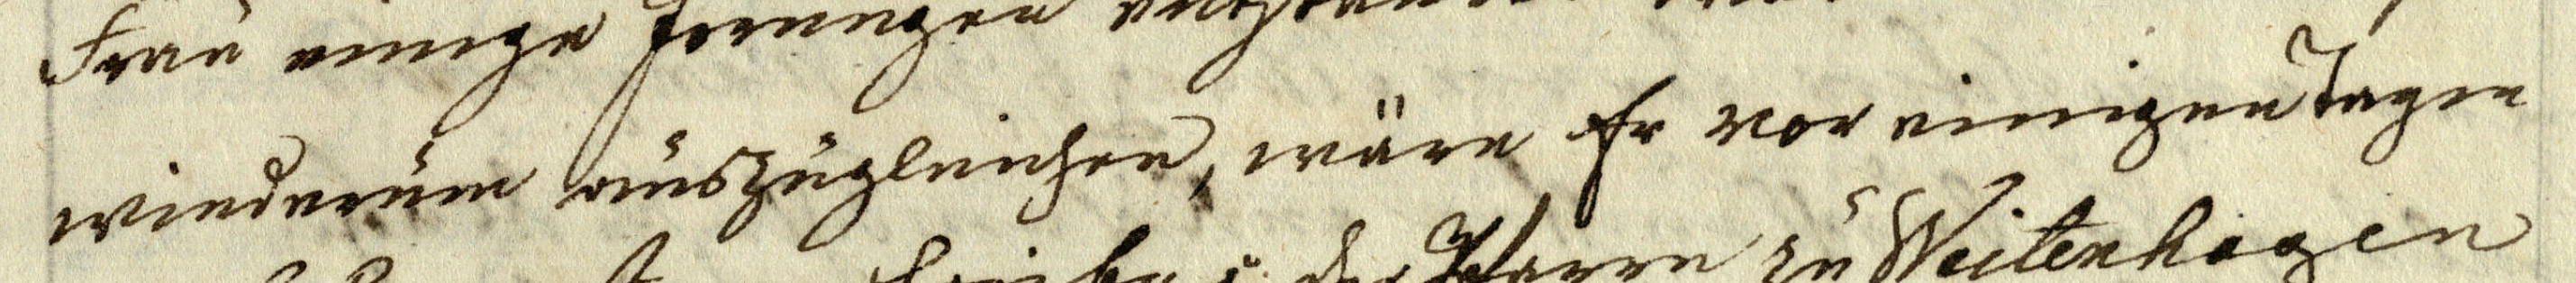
wiederum auszugleichen, wäre Er vor einigen Tagen
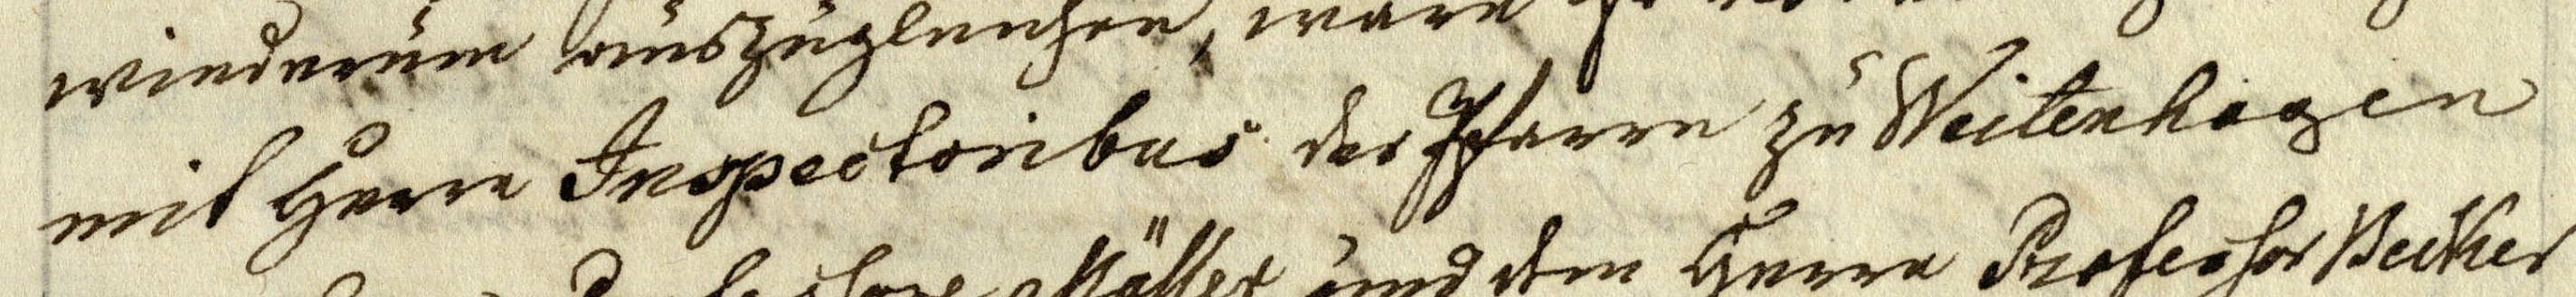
mit Herrn Inspectoribus der Pfarre zu Weitenhagen
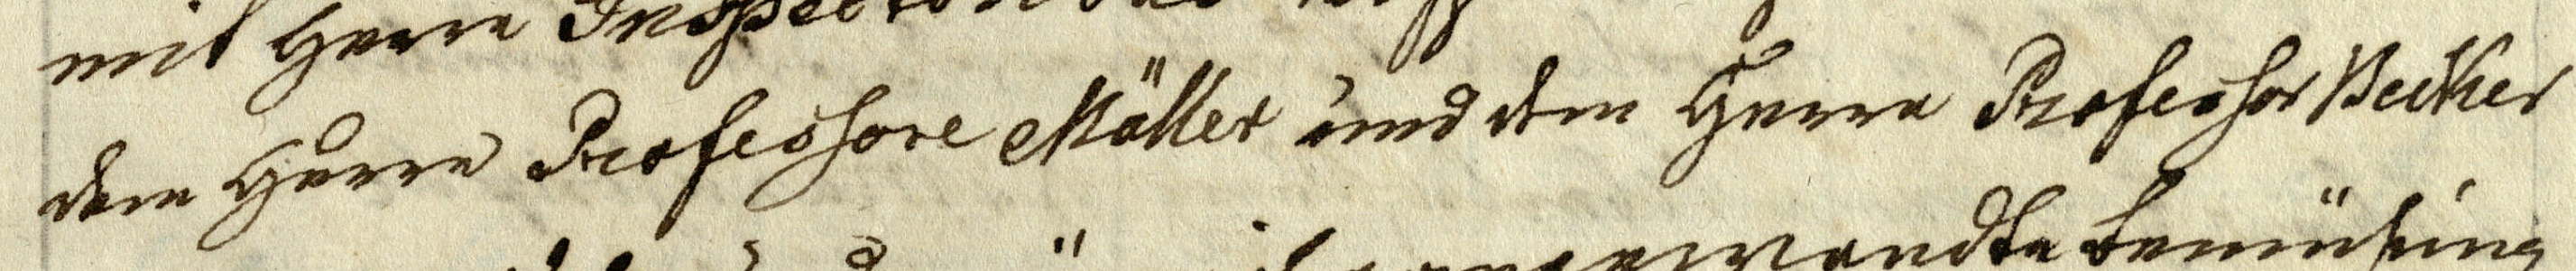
dem Herrn Professore Möller und dem Herrn Professor Becker
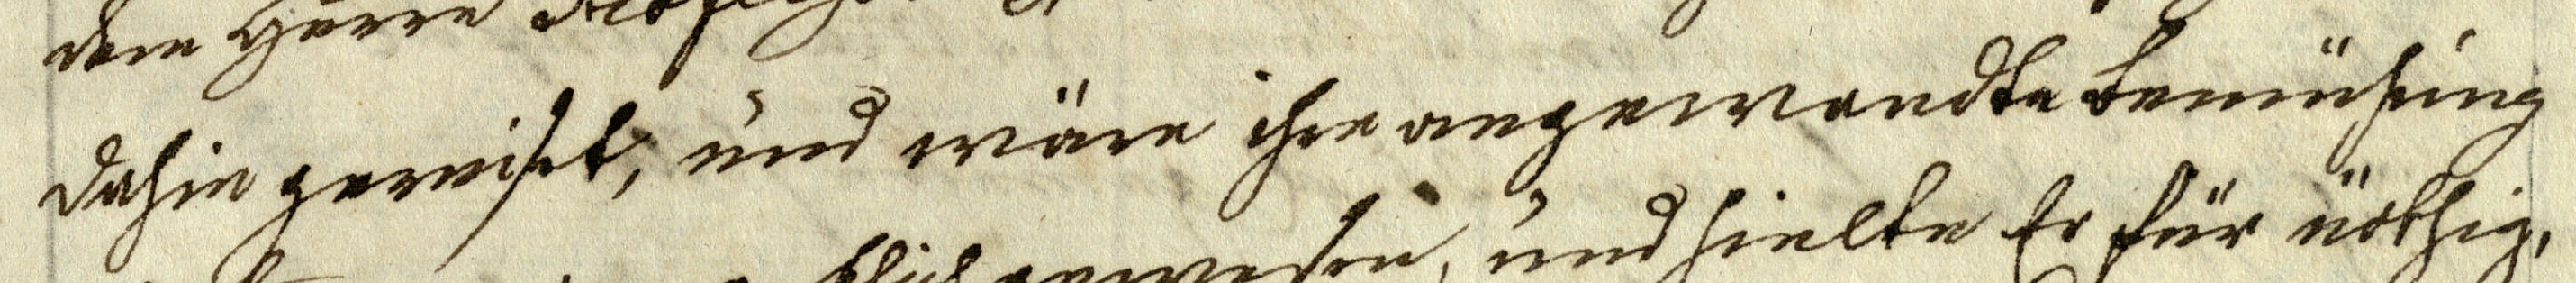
dahin gereiset, und wäre ihm angewandte Bemühung
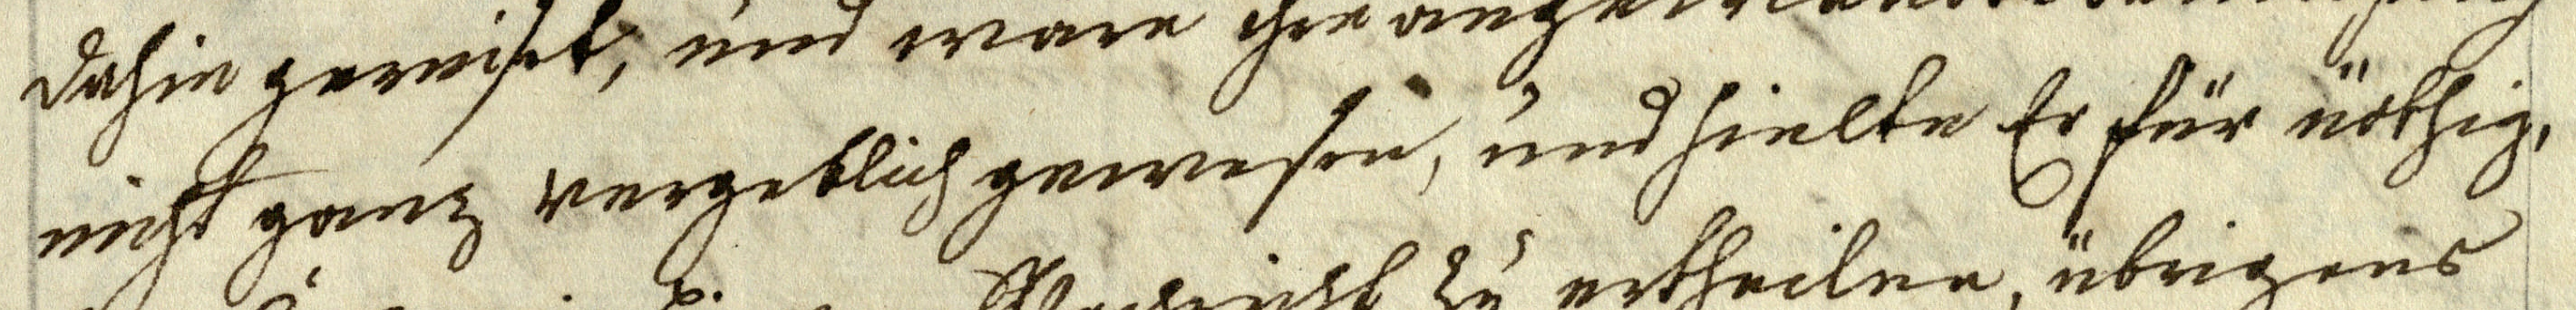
nicht ganz vergeblich gewesen, und hielte Er für nöthig,
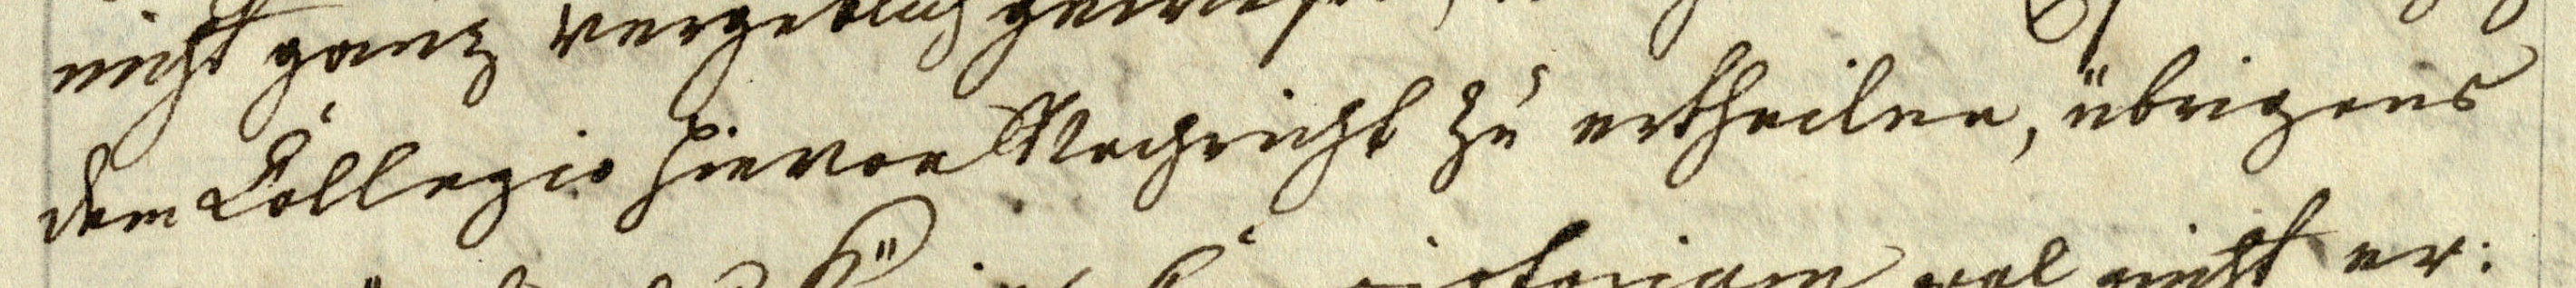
dem Collegio hievon Nachricht zu ertheilen, übrigens
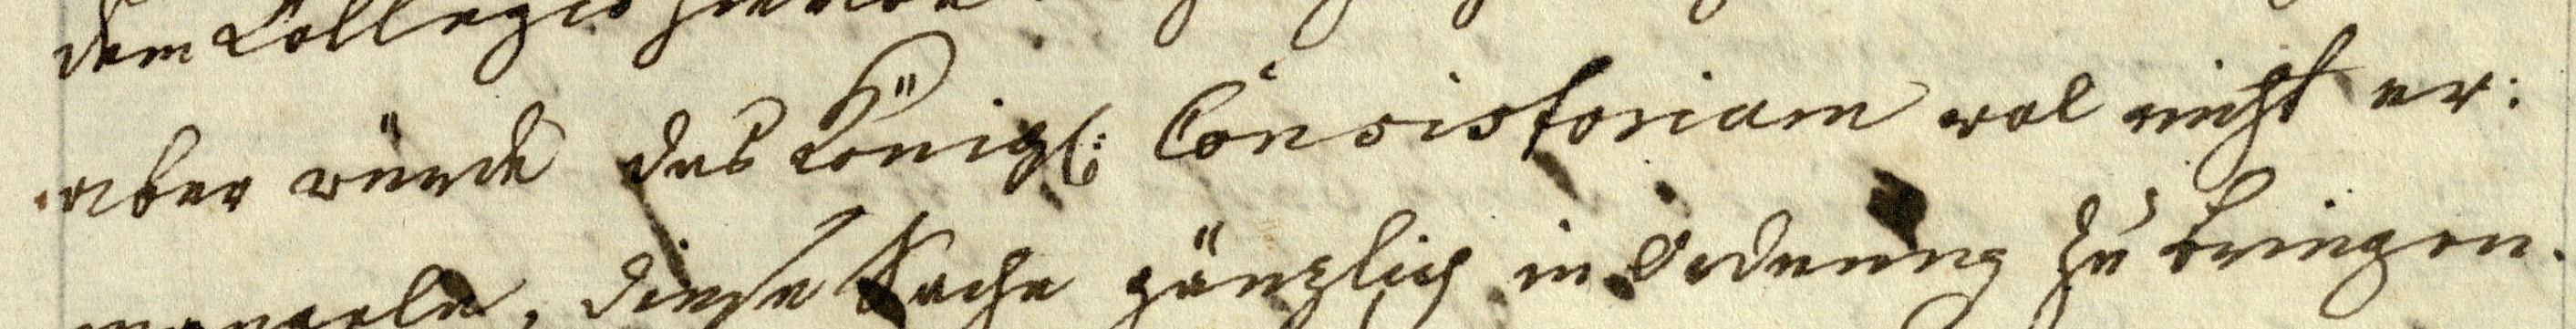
aber würde das Königl. Consistorium wol nicht er¬
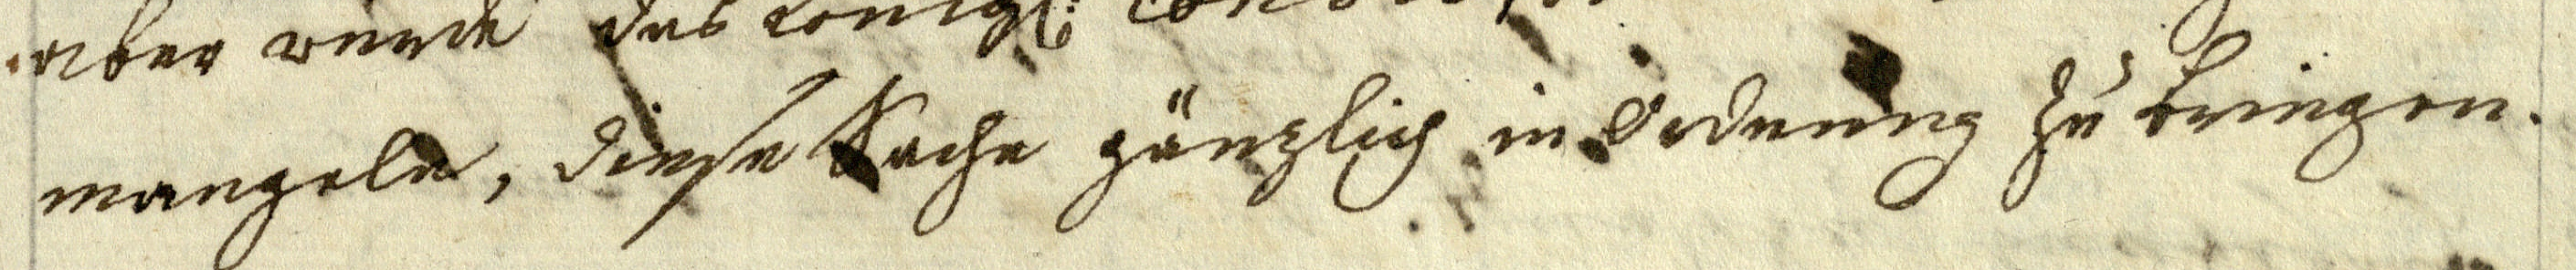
mangeln, diese Sache gänzlich in Ordnung zu bringen.
